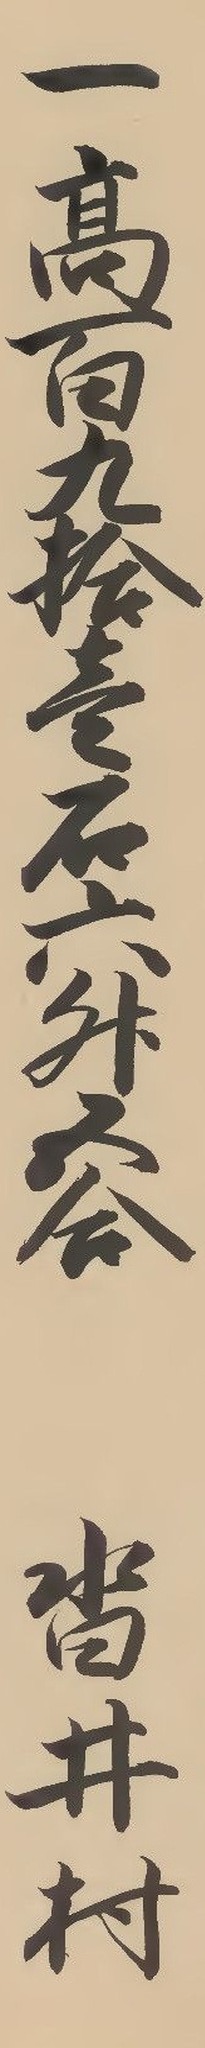一高百九拾壱石六升五合沓井村
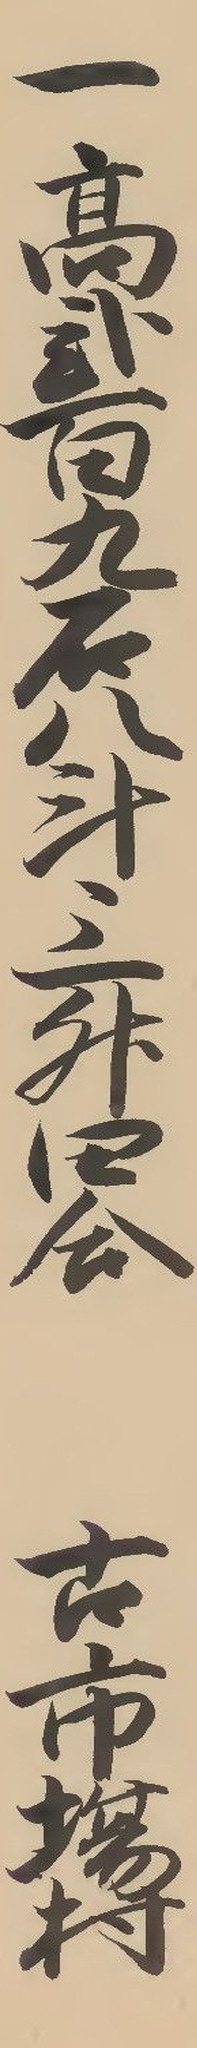一高弐百九石八斗三升四合古市場村

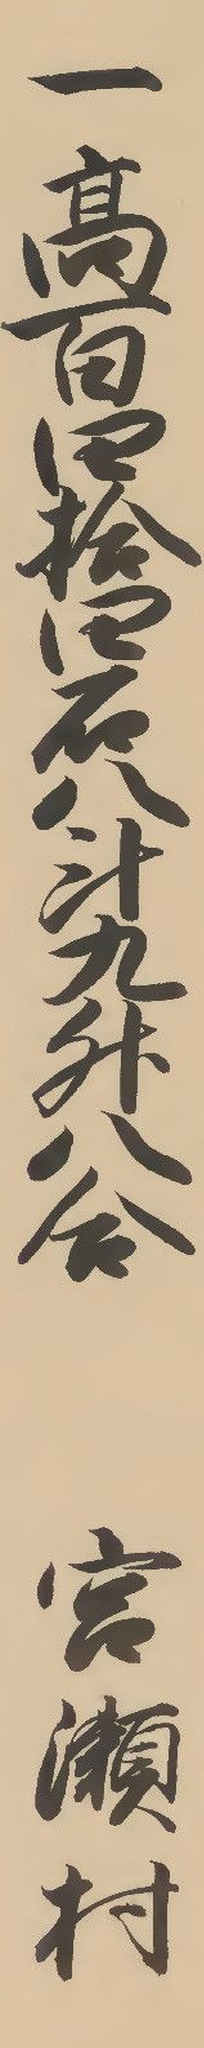一高百四拾四石八斗九升八合宮瀬村
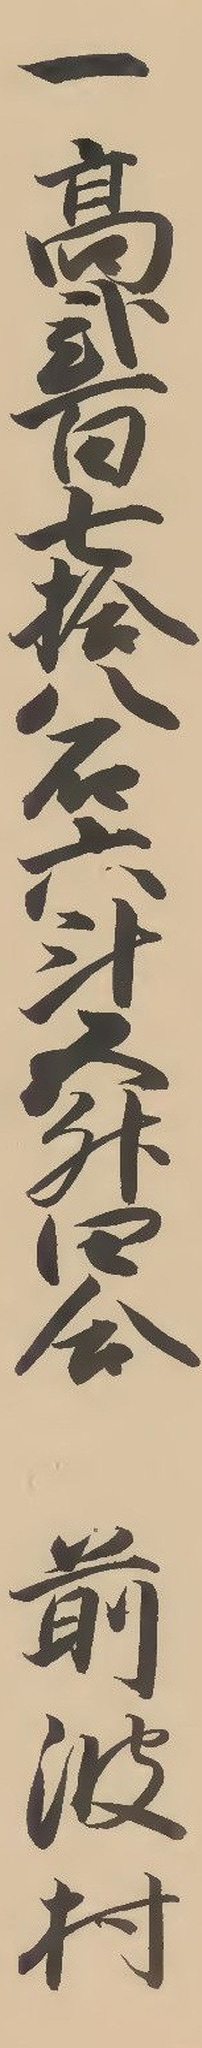一高弐百七拾八石六斗五升四合前波村
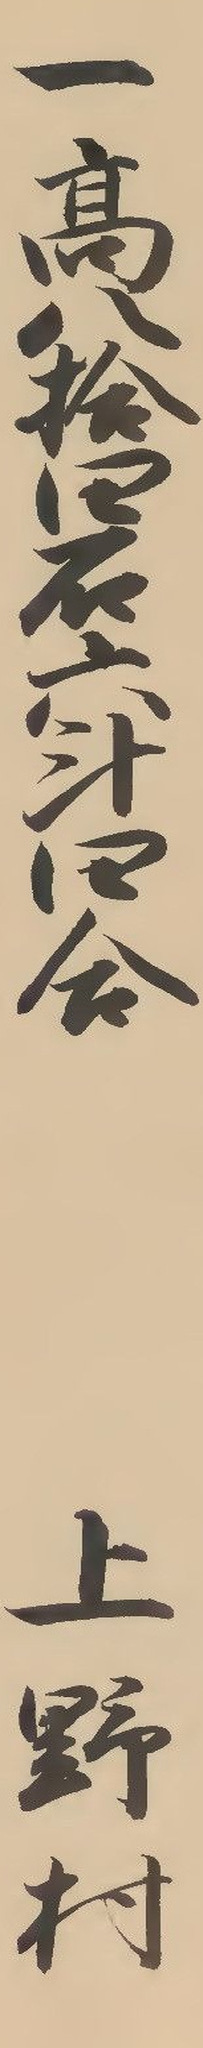一高八拾四石六斗四合上野村
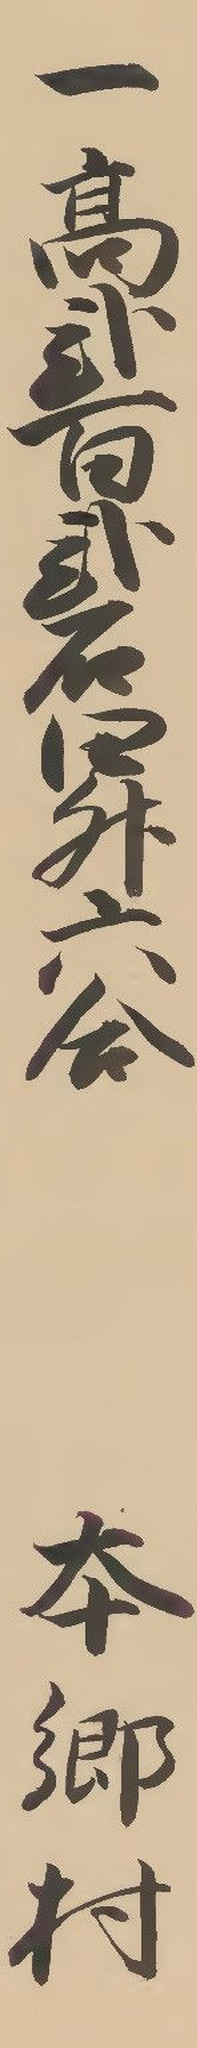一高弐百弐石四升六合本郷村
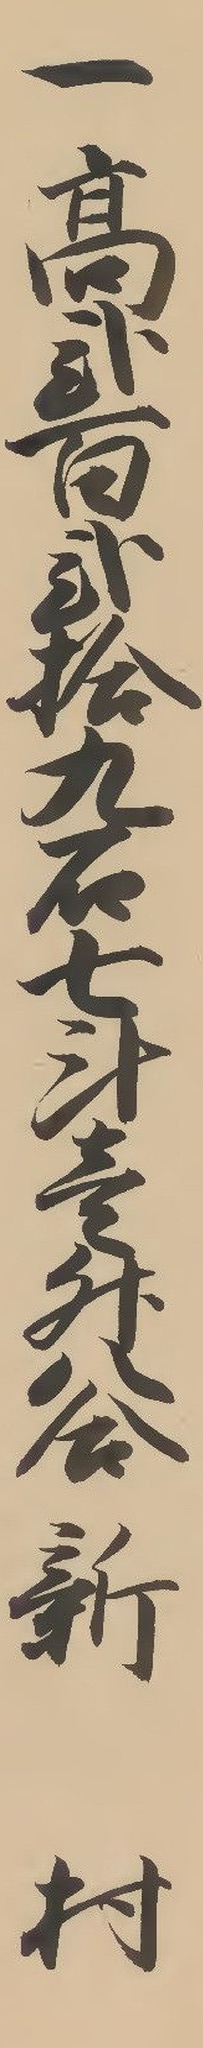一高弐百弐拾九石七斗壱升八合新村
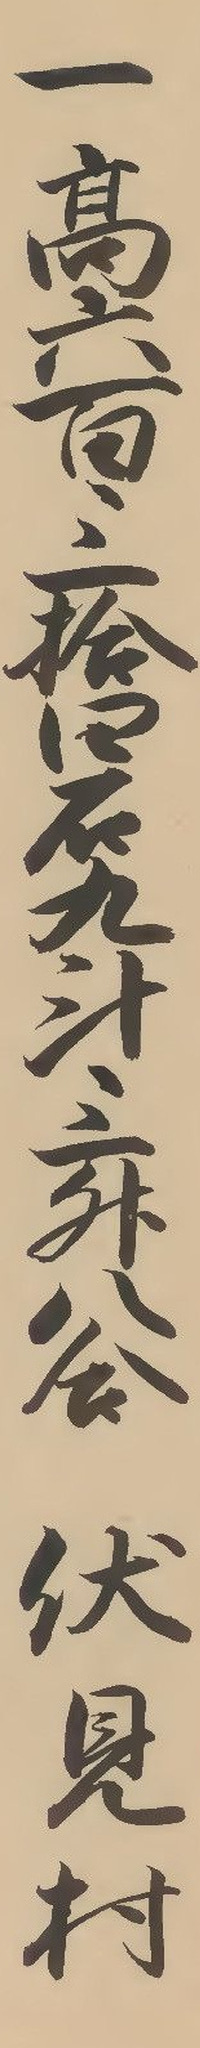一高六百三拾四石九斗三升八合伏見村
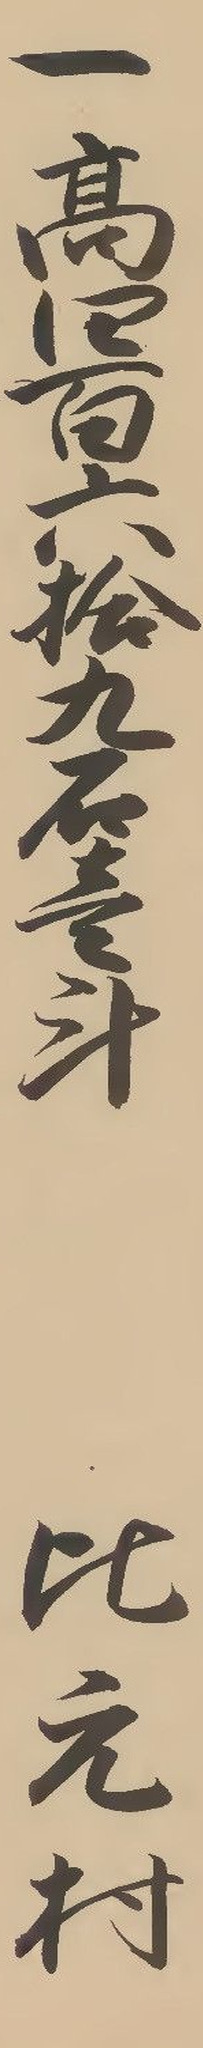一高四百六拾九石壱斗比元村
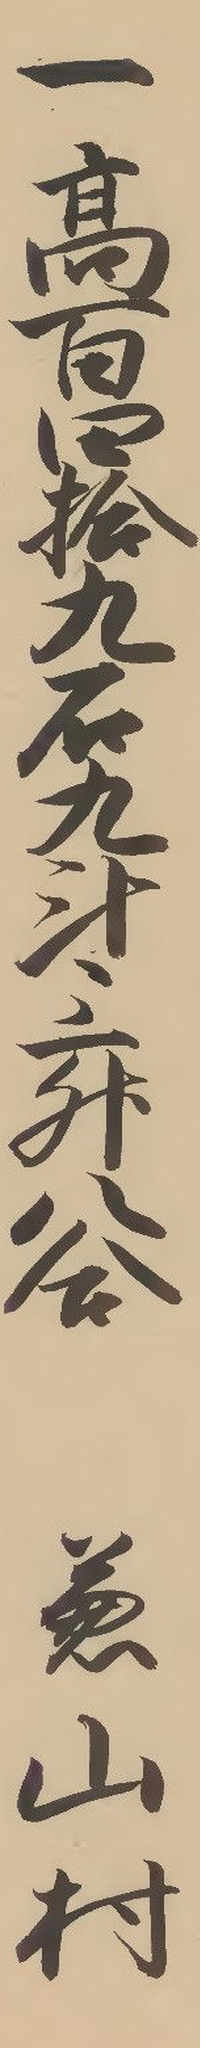一高百四拾九石九斗三升八合兼山村

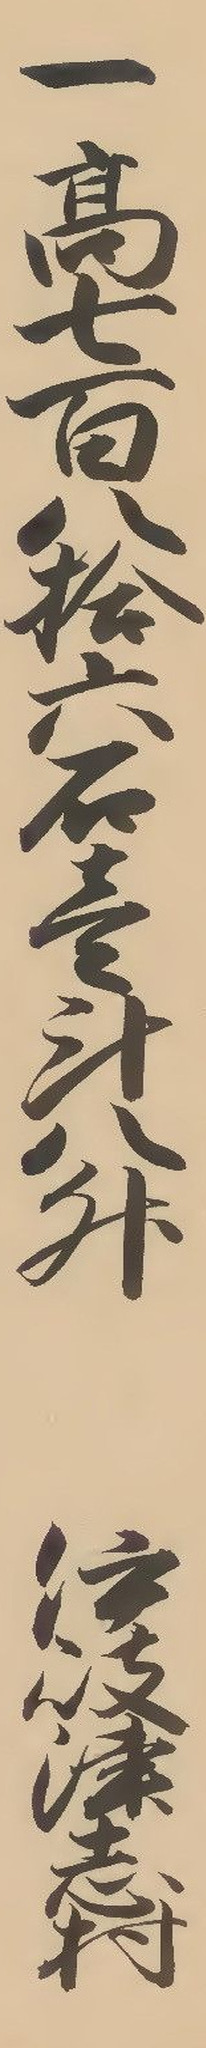一高七百八拾六石壱斗八升伊岐津志村
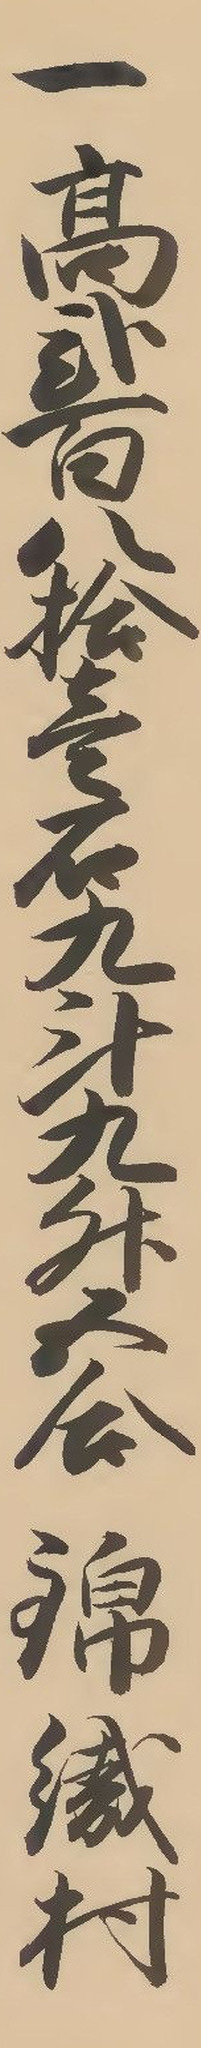一高弐百八拾壱石九斗九升五合錦織村

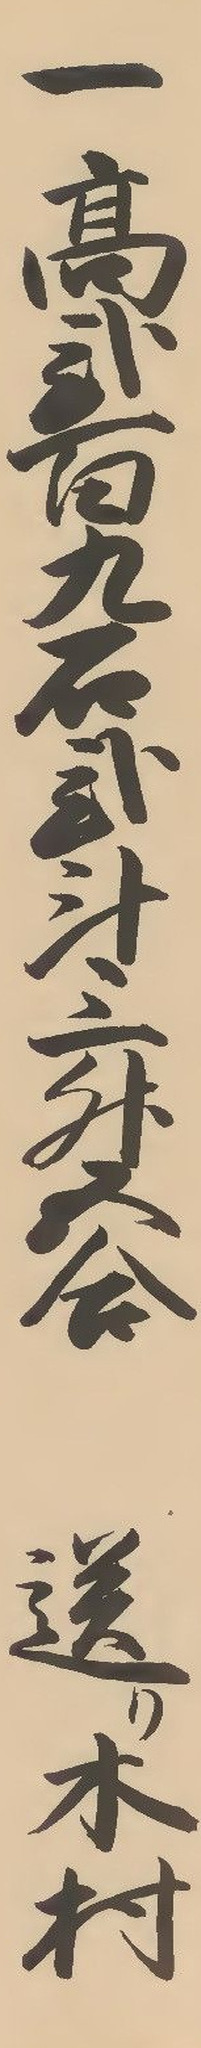一高弐百九石弐斗三升五合送り木村
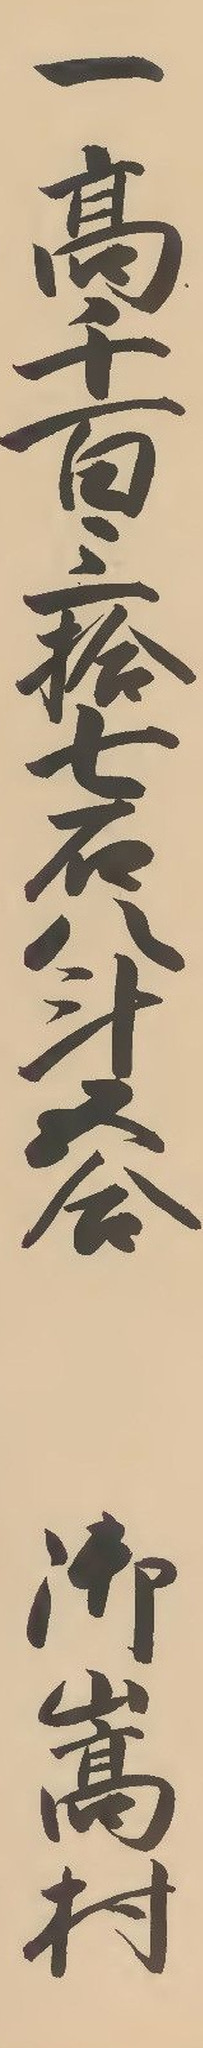一高千百三拾七石八斗五合御嵩村
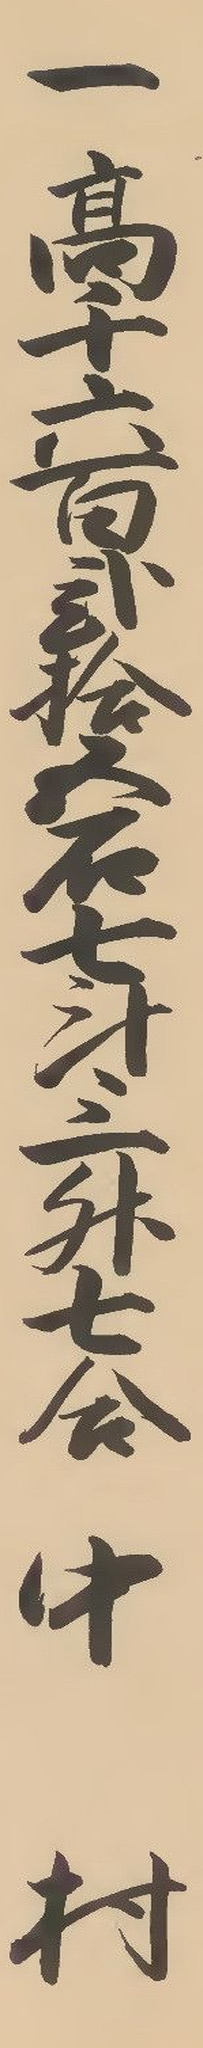一高千六百弐拾五石七斗三升七合中村

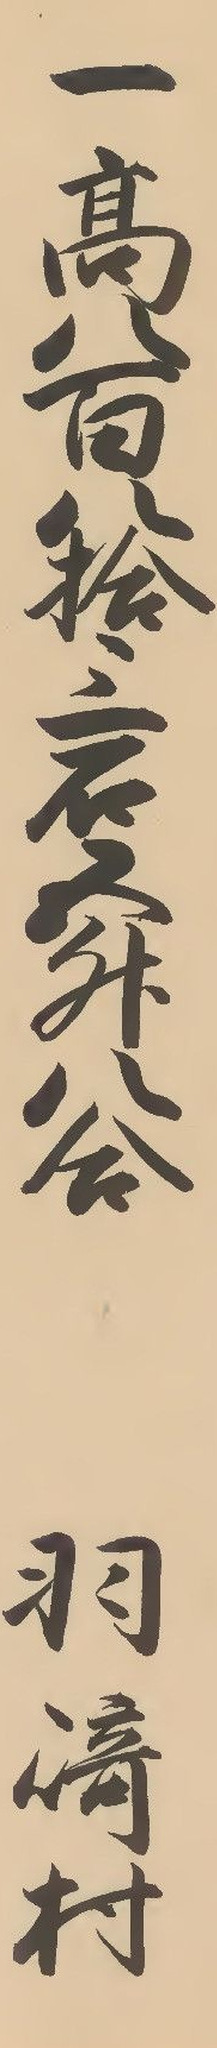一高八百八拾三石五升八合羽崎村
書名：美濃国郷帳
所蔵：国立公文書館 National Archives of Japan
